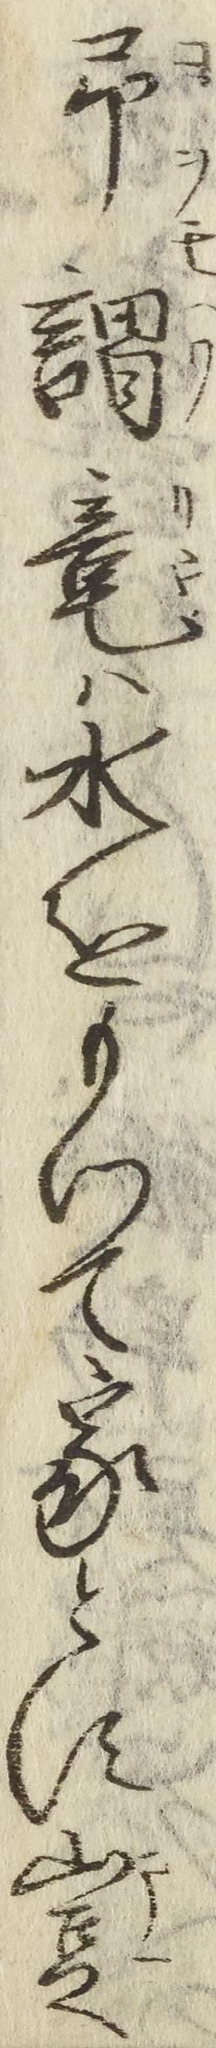予謂竜は水をもつて家とす豈

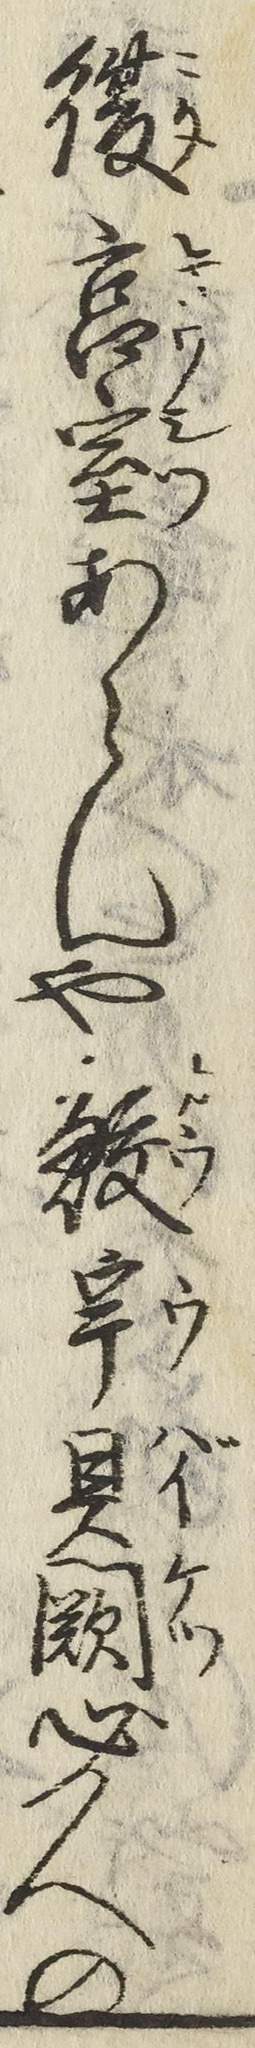復宮室あらんや鮫宇貝闕必人の
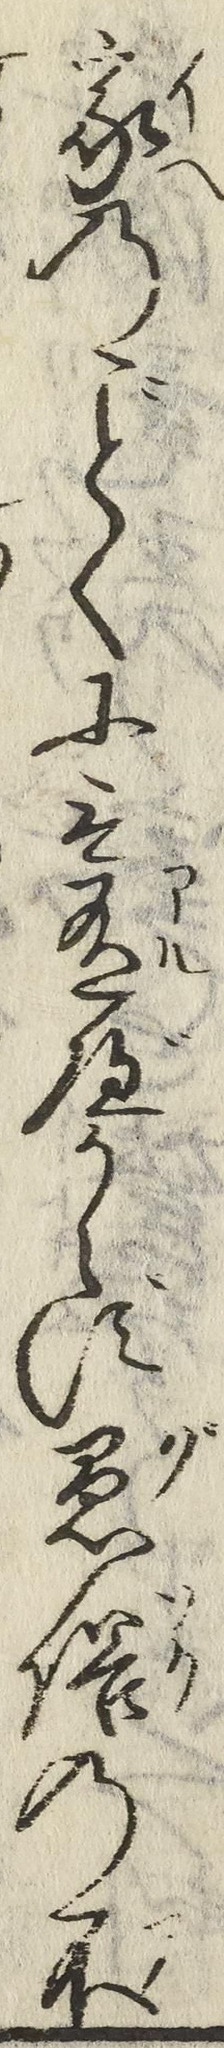家のごとくに云有べからず愚俗の不
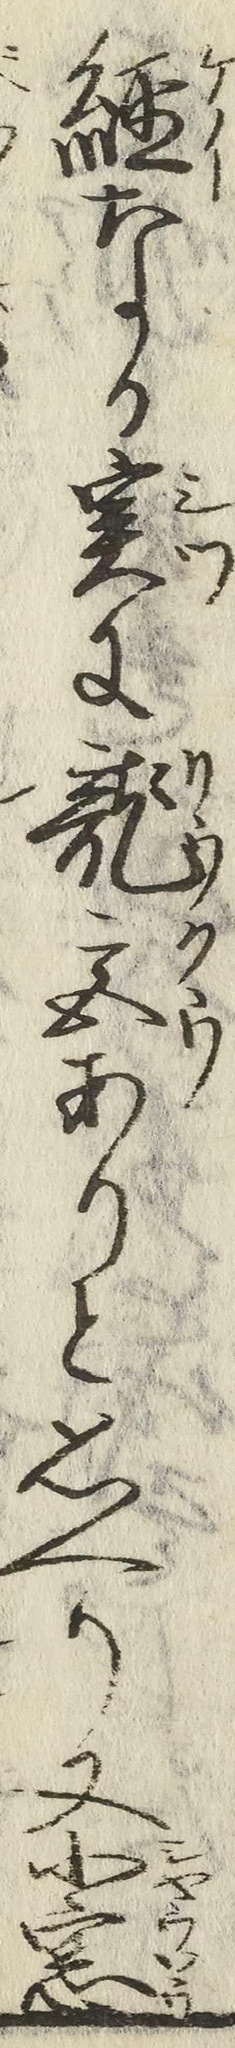経なり実に龍宮ありと思へり又小窓
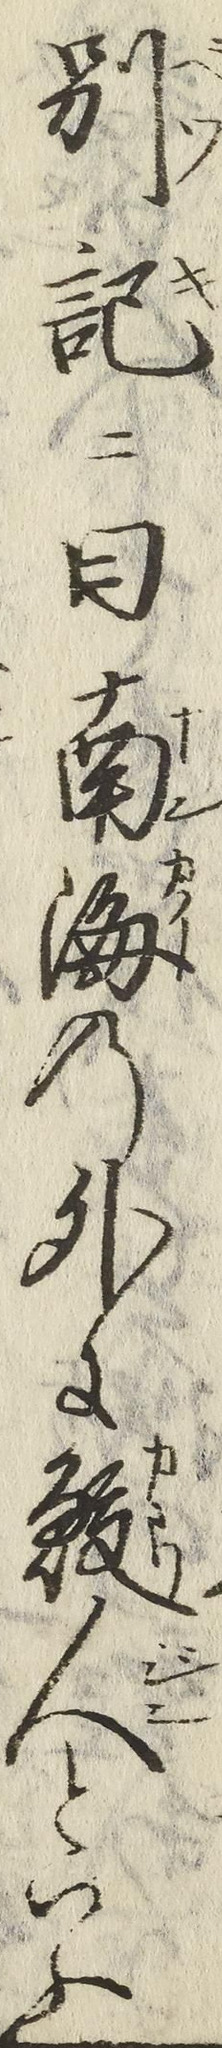別記ニ曰南海の外に鮫人といふ
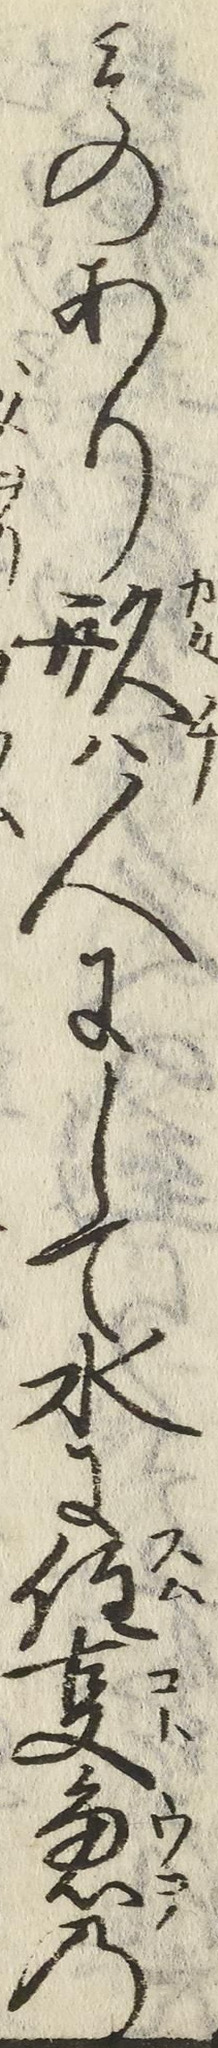ものあり形は人にして水に住事魚の
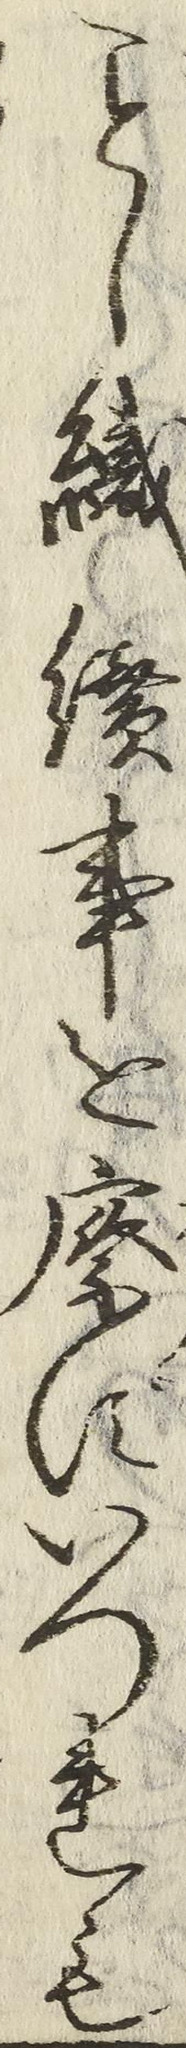ごとし織続事を廃ずいつれも
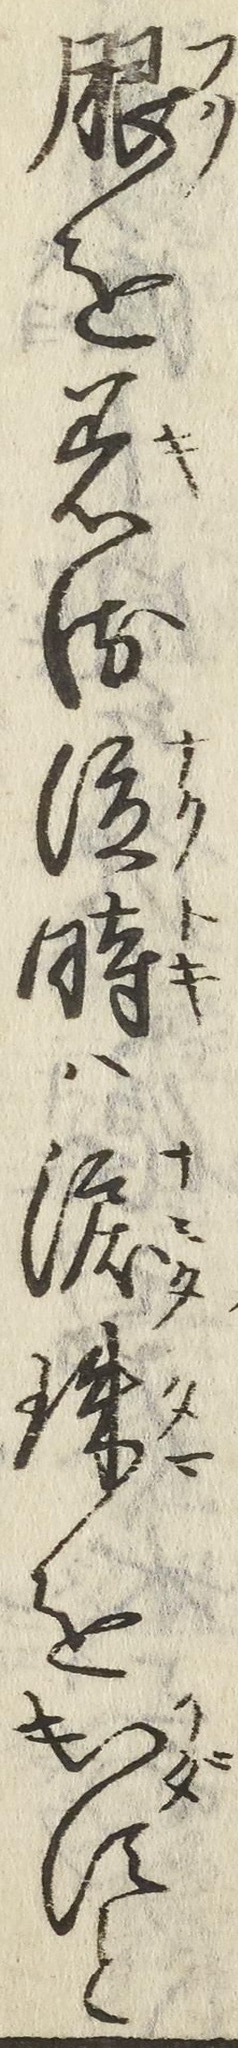服を着る泣時は涙珠を長すと
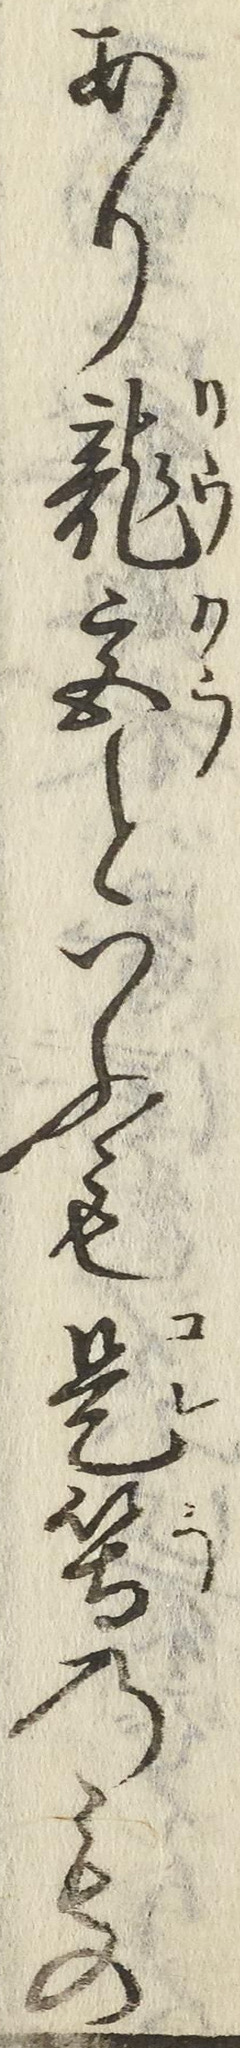あり龍宮といふも是等のもの
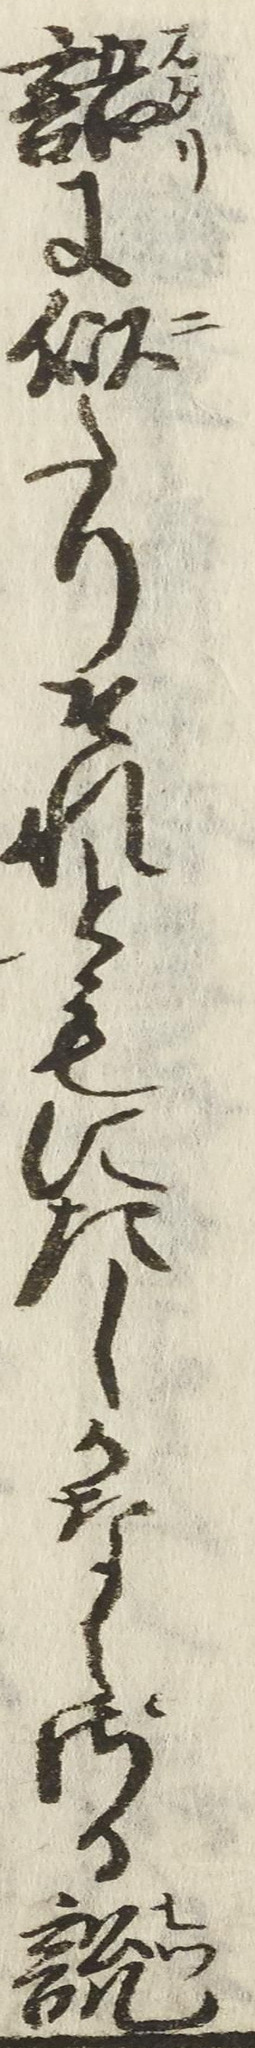語に似たりそれともにたしかならざる説
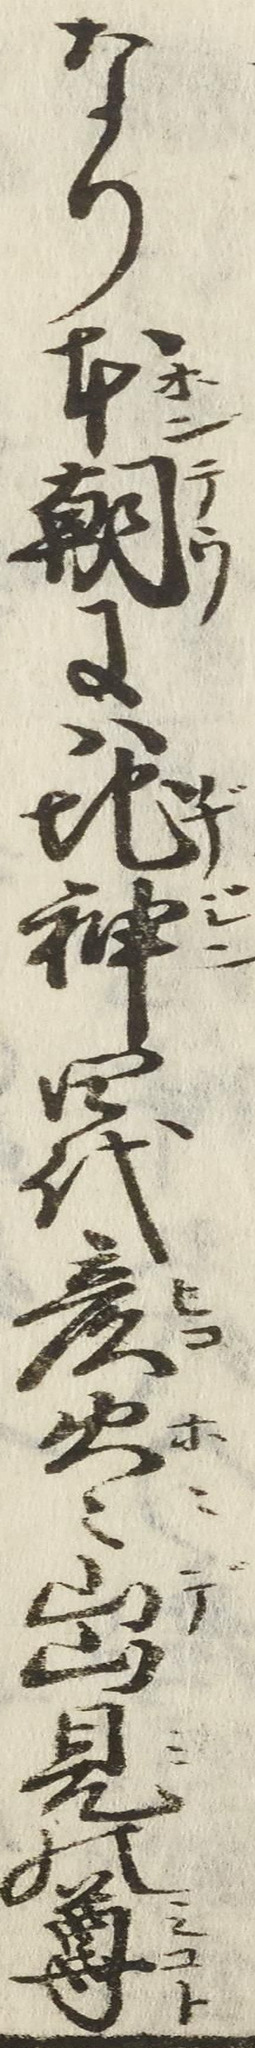なり本朝には地神四代彦火火出見の尊
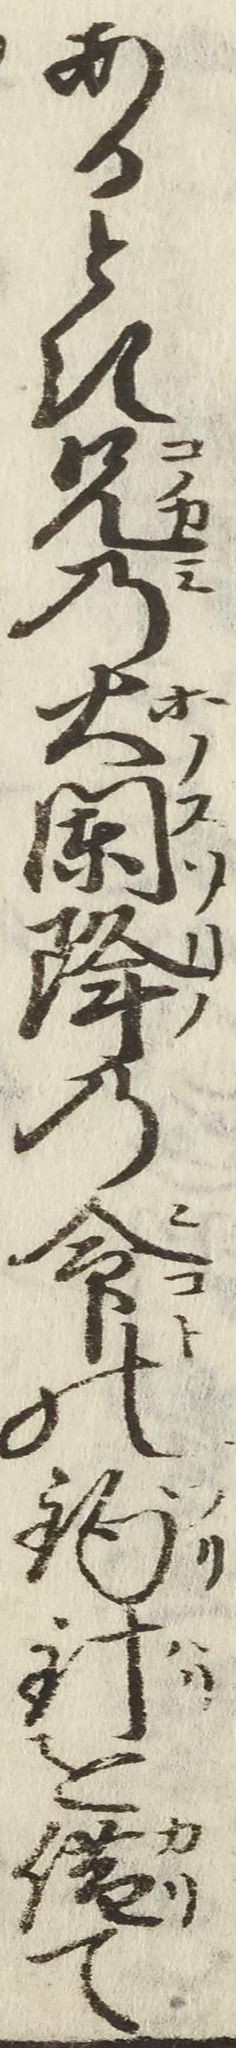あるとき兄の火闌降の命の釣針を借て
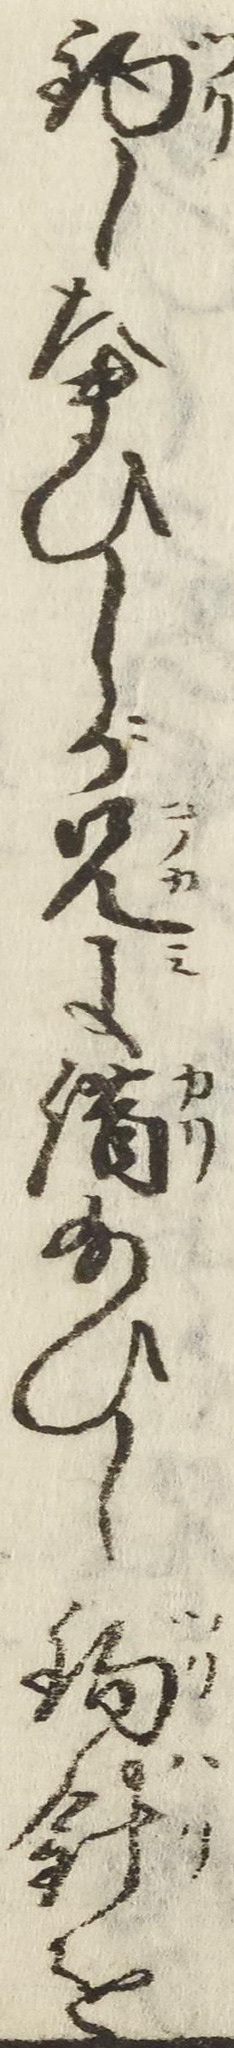釣したまひしが兄に借給ひし釣針を
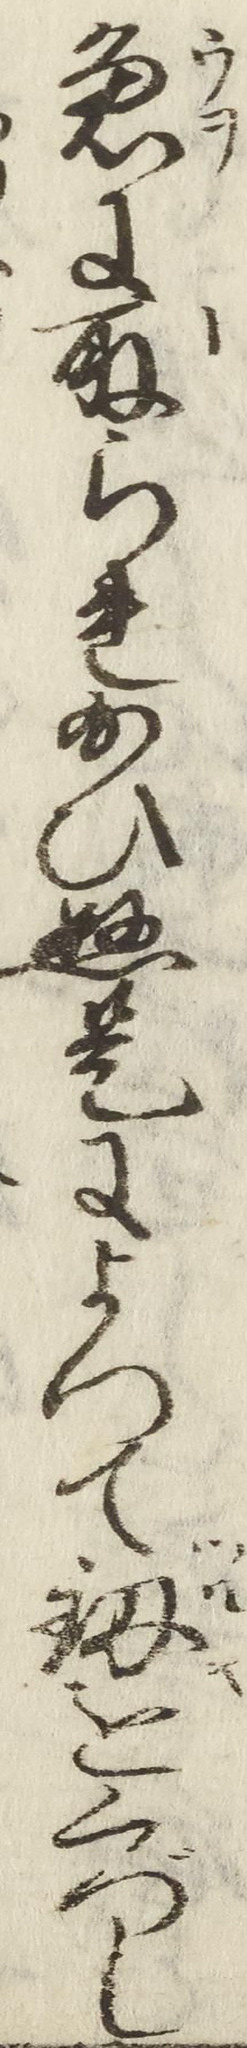魚に取られ給ひぬ是によつて剱をくづし
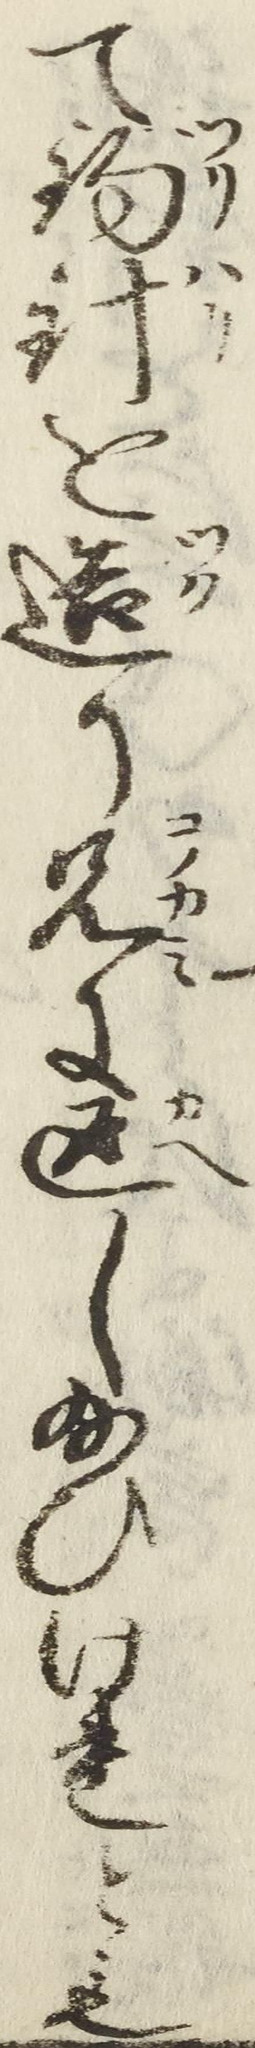て釣針を造り兄に返し給ひけれとも
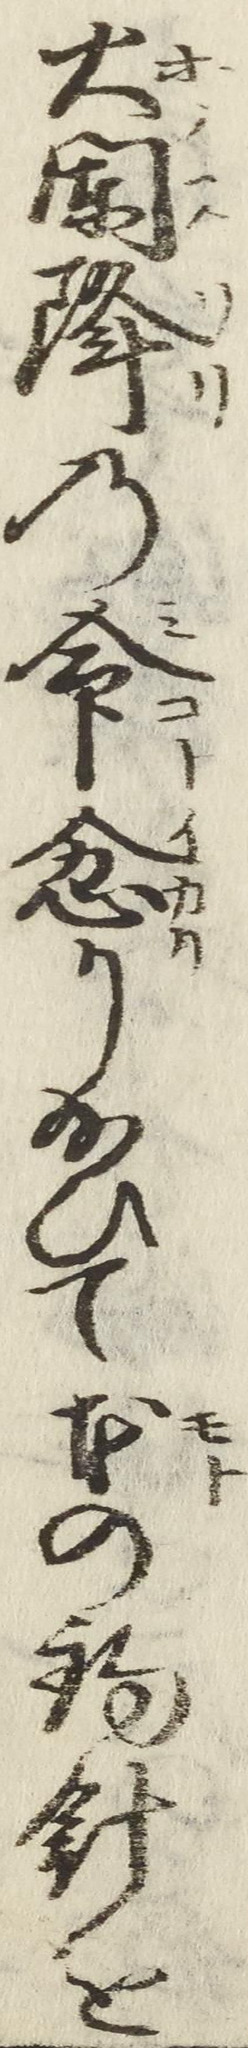火闌降の命忿り給ひて本の釣針を
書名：天地或問珍　天
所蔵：東京大学地震研究所図書室 Earthquake Research Institute Library, The University of Tokyo, JAPAN
